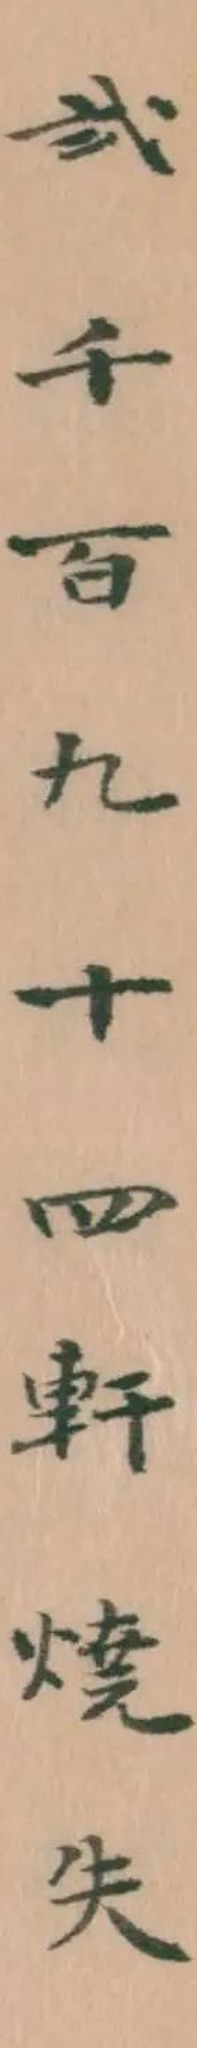弐千百九十四軒焼失
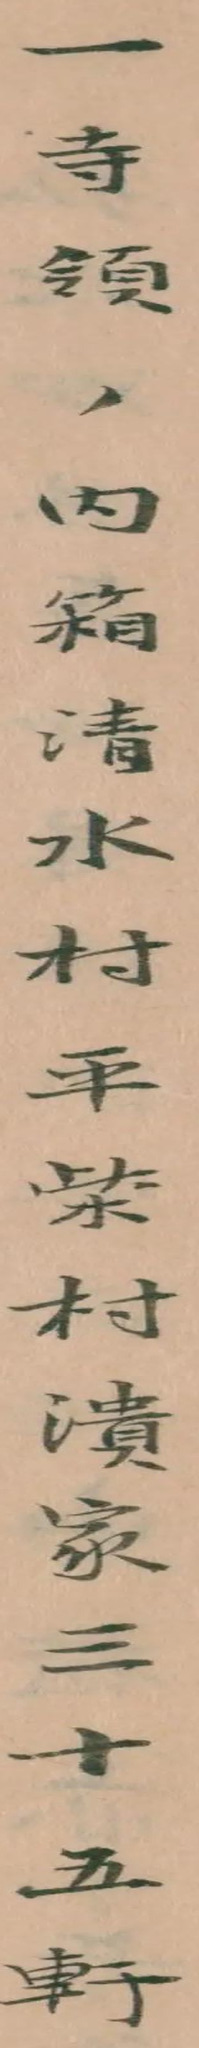一寺領ノ内箱清水村平柴村潰家三十五軒
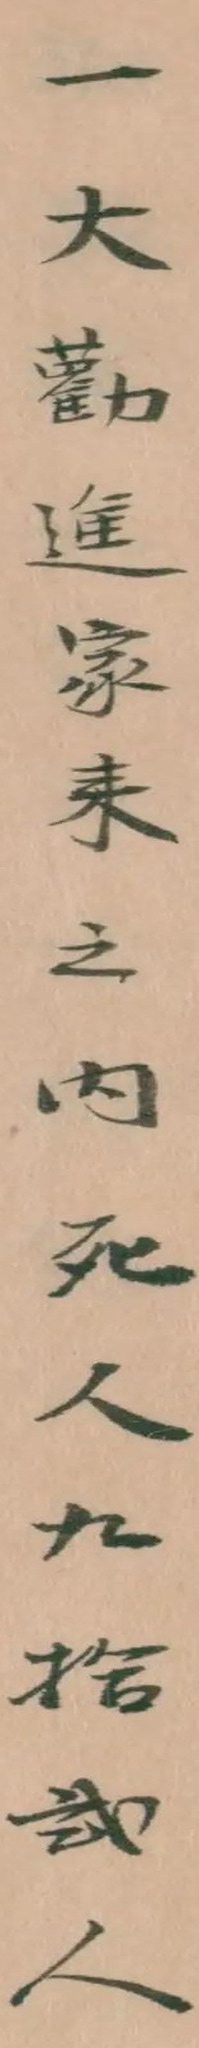一大勧進家来之内死人九十弐人
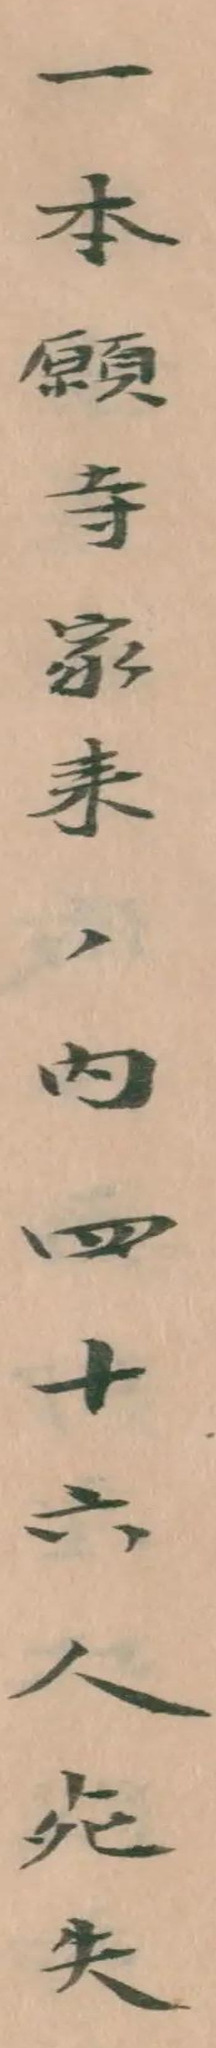一本願寺家来ノ内四十六人死失
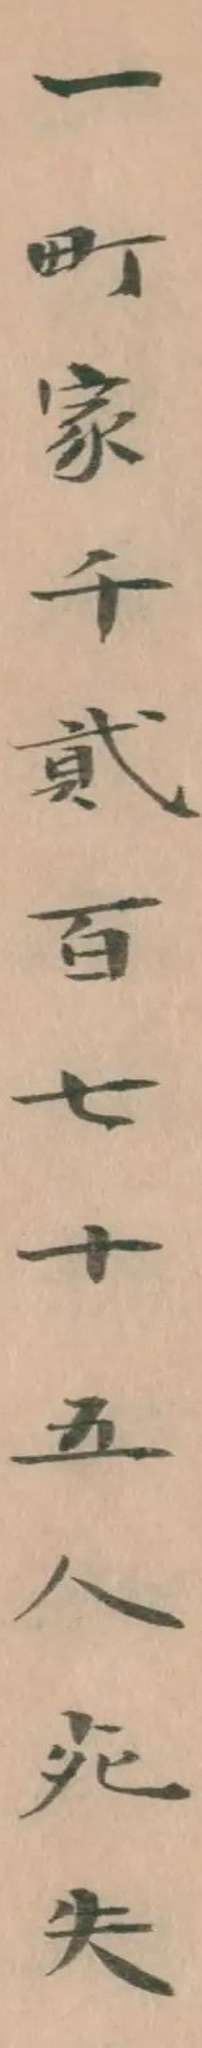一町家千貮百七十五人死失
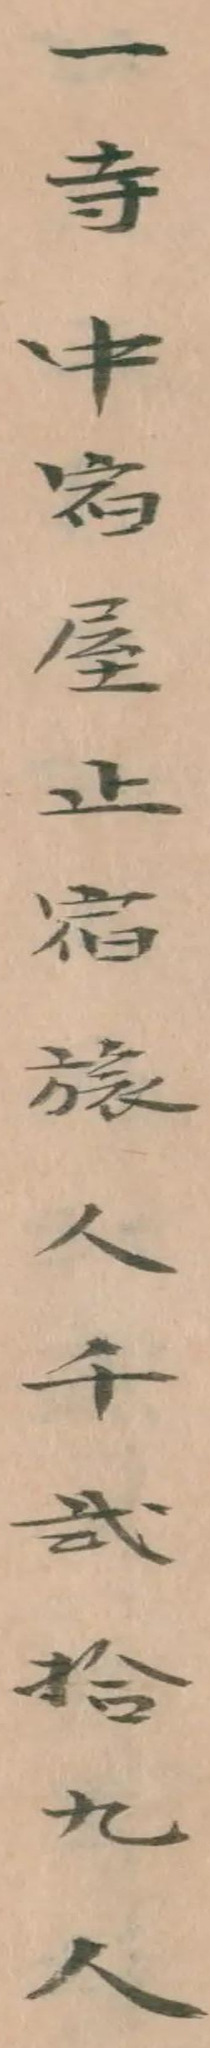一寺中宿屋止宿旅人千弐拾九人
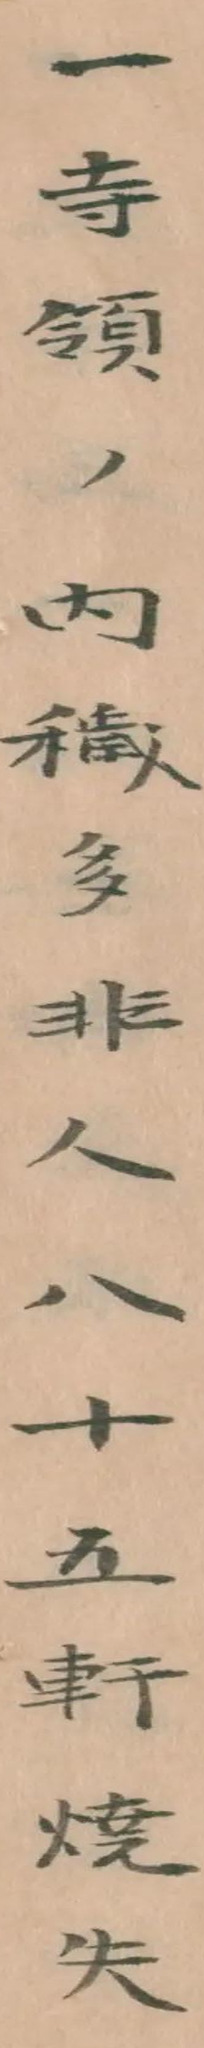一寺領ノ内穢多非人八十五軒焼失

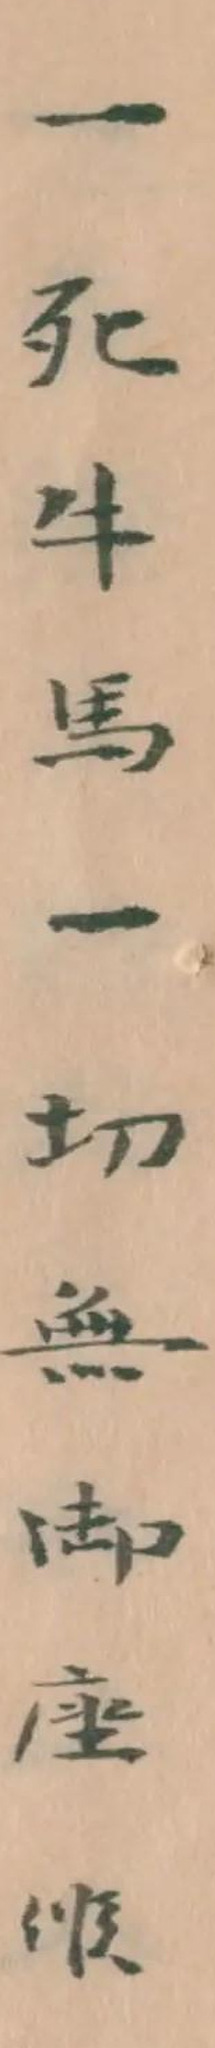一死牛馬一切無御座候
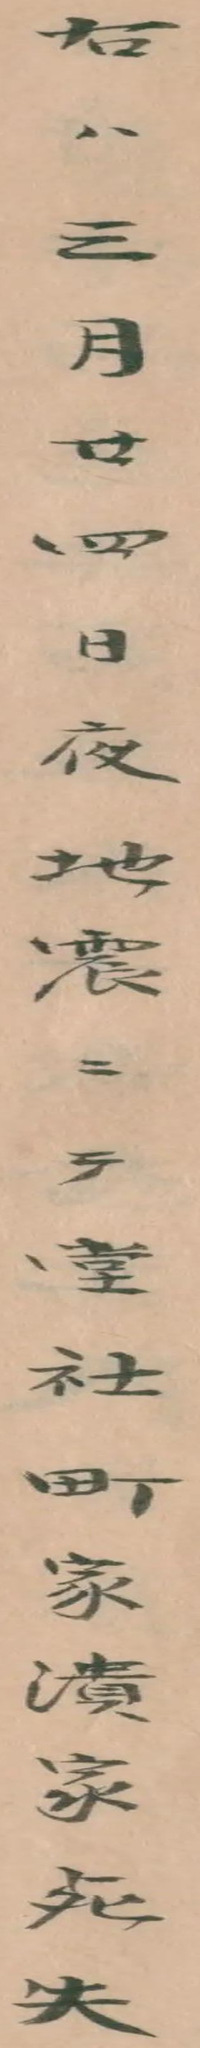右ハ三月廿四日夜地震ニテ堂社町家潰家死失
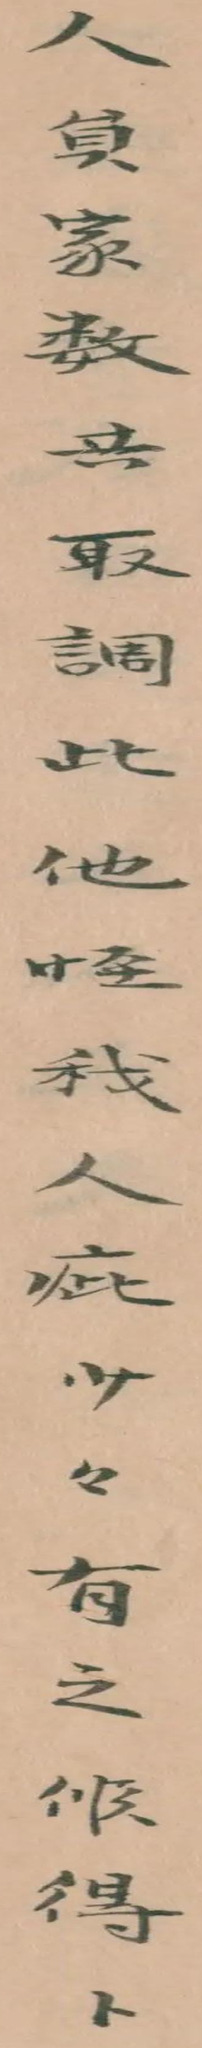人員家数共取調此他怪我人疵少々有之候得ト
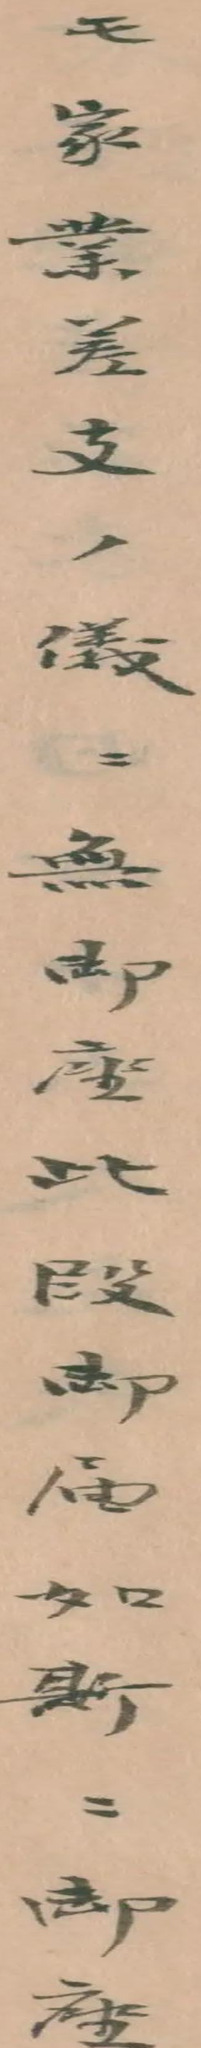モ家業差支ノ儀ニ無御座此段御届如斯ニ御座
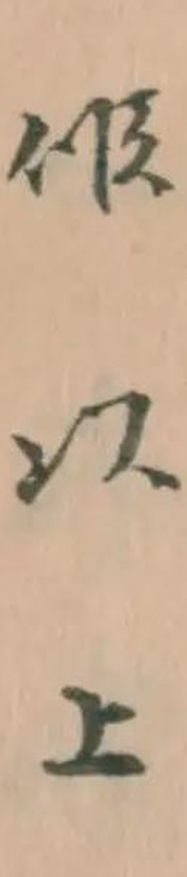候以上
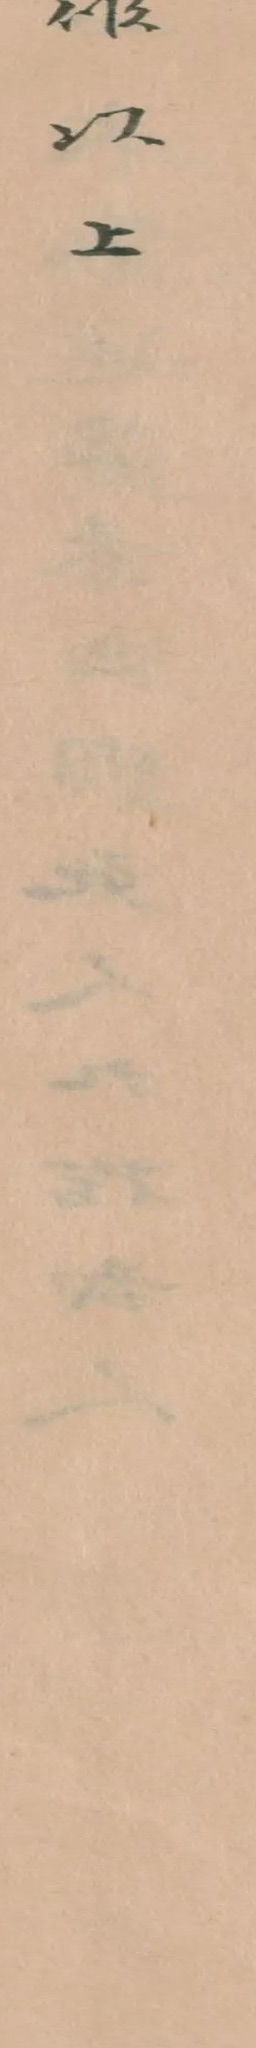候以上
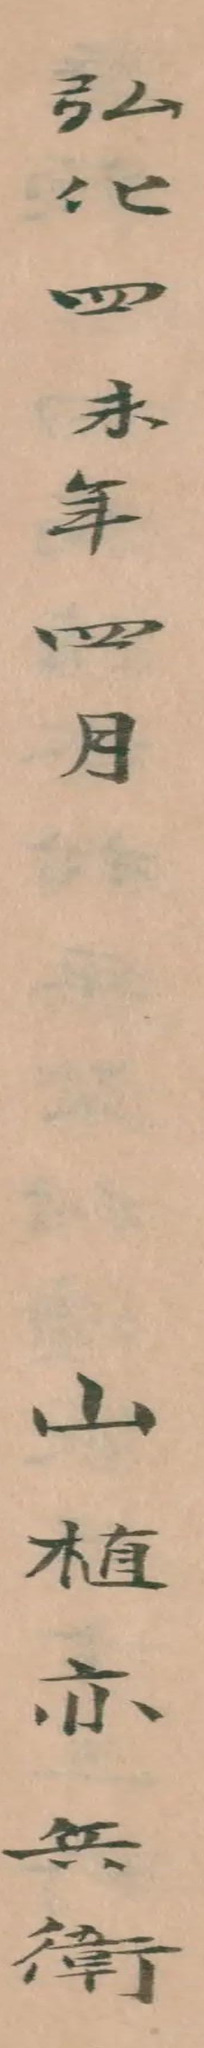弘化四未年四月山植亦兵衛
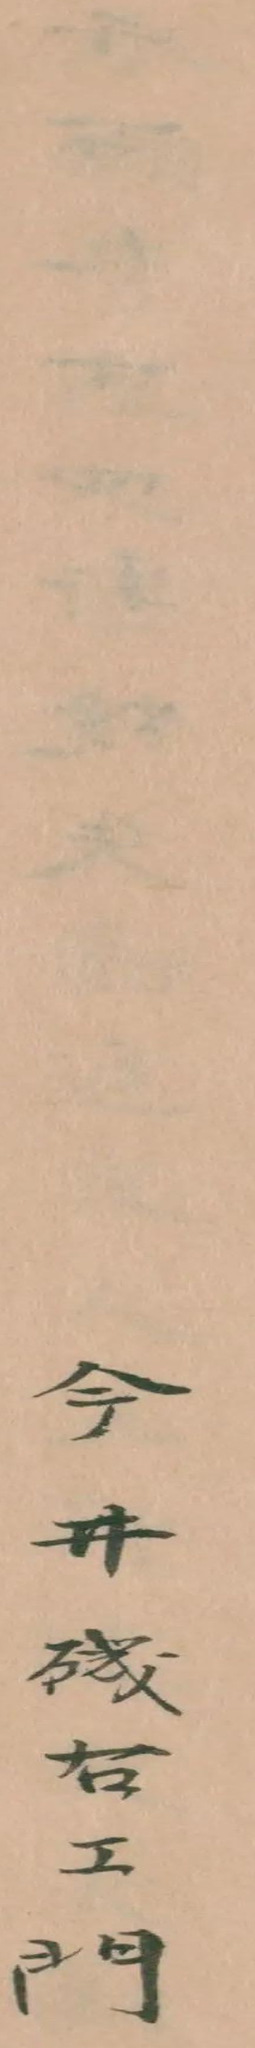今井磯右エ門
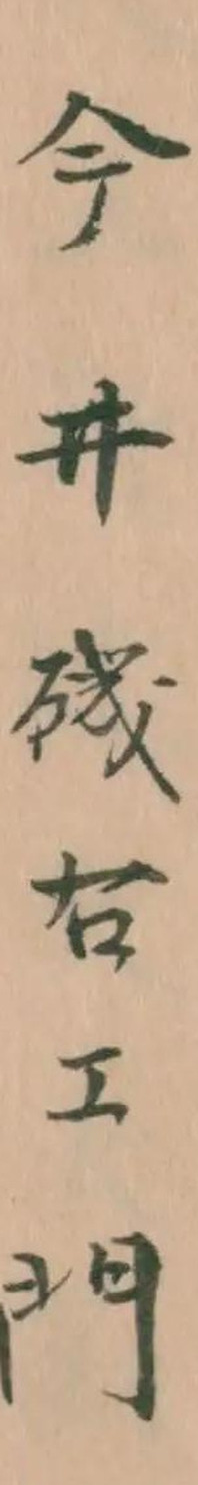今井磯右エ門
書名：地災撮要. 巻5-6(地震之部)
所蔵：国立国会図書館 National Diet Library, JAPAN
